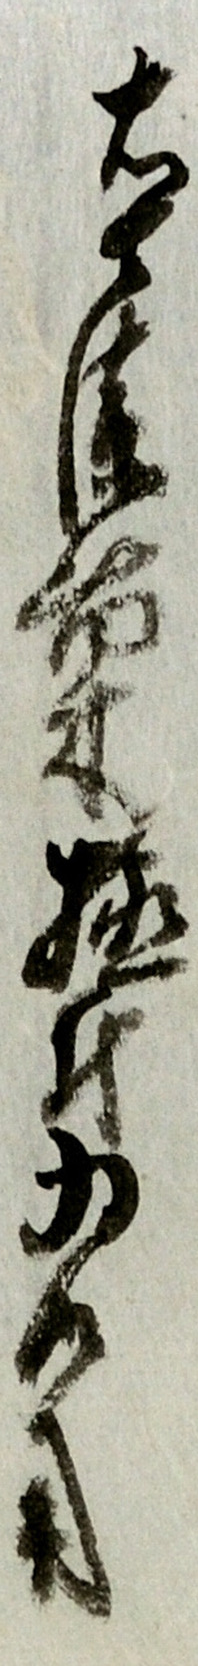右は漆苗木植付為御用
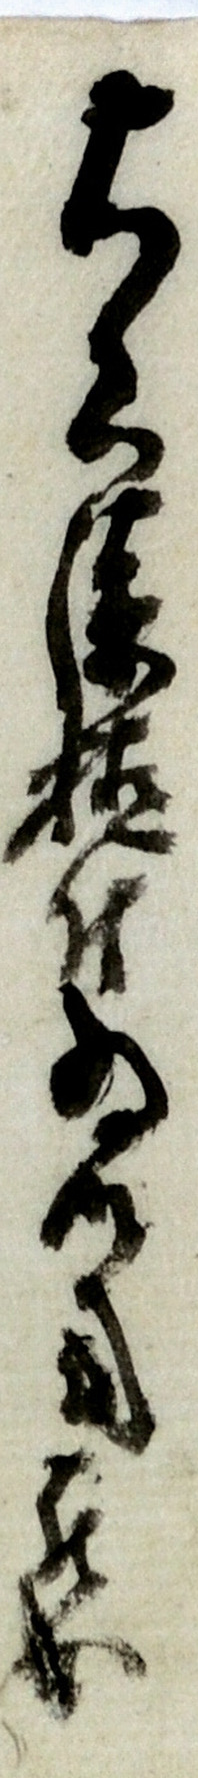右は漆苗木植付為御用

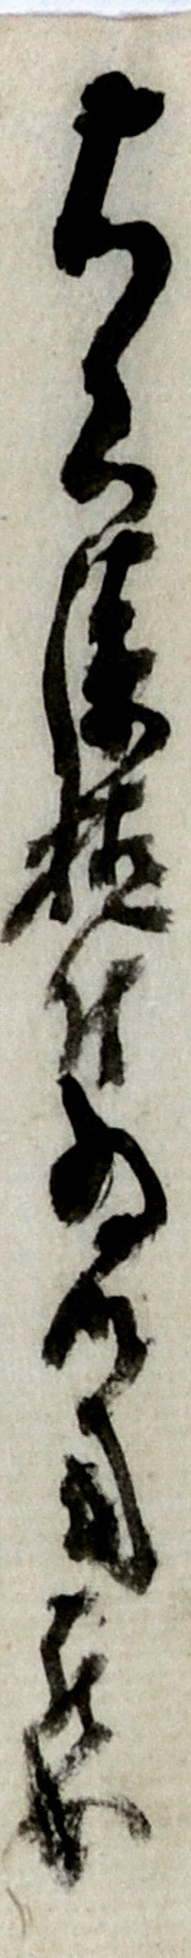右は漆植付為御用罷出
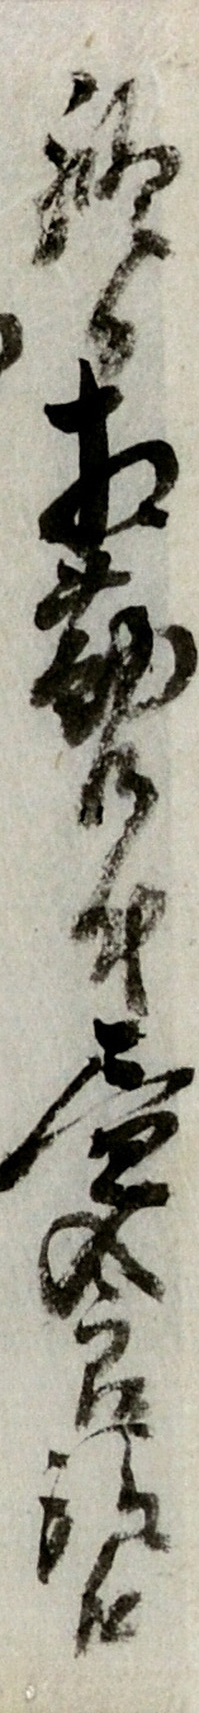終日相勤候付昼食請取
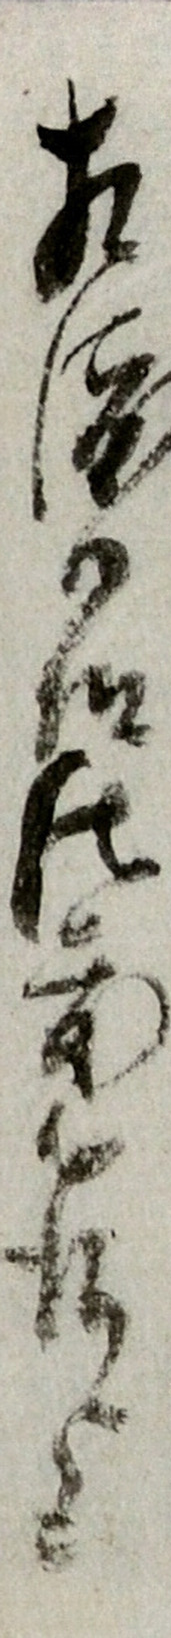相渡候様仕度奉存候以上
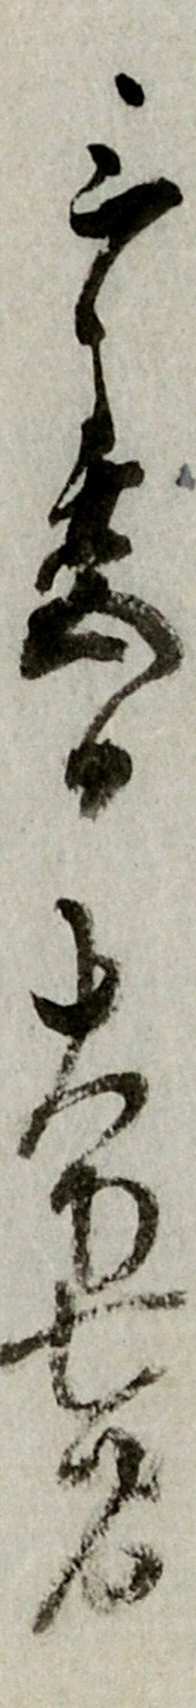三月廿五日大下久左衛門
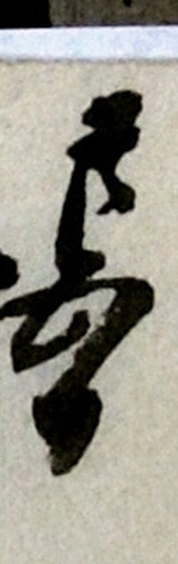廿五日
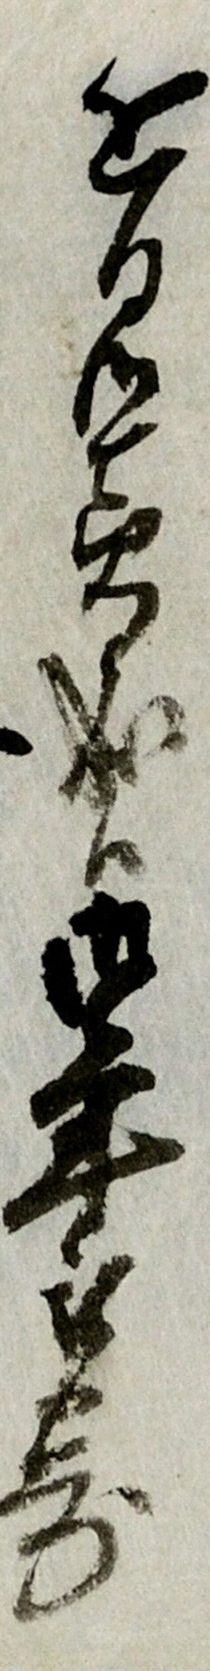近日御受成候御年被寄
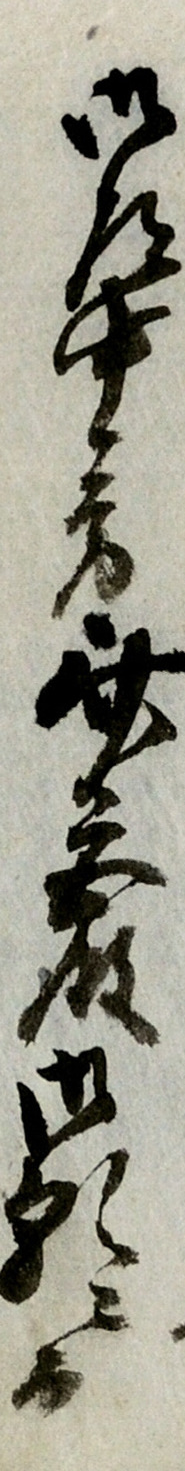御道中之方斎宮殿御願ニ而
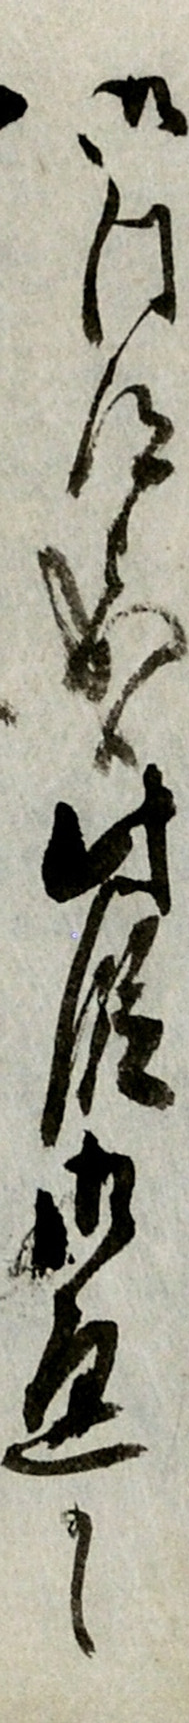御同道被成候此段御連々
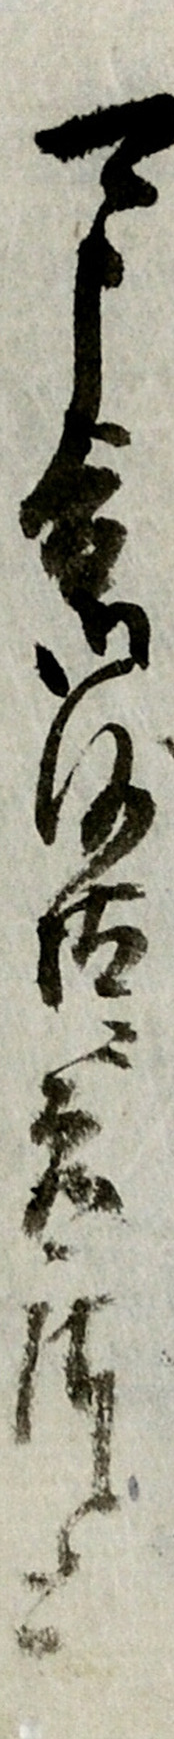可申旨御沙汰ニ御座候以上
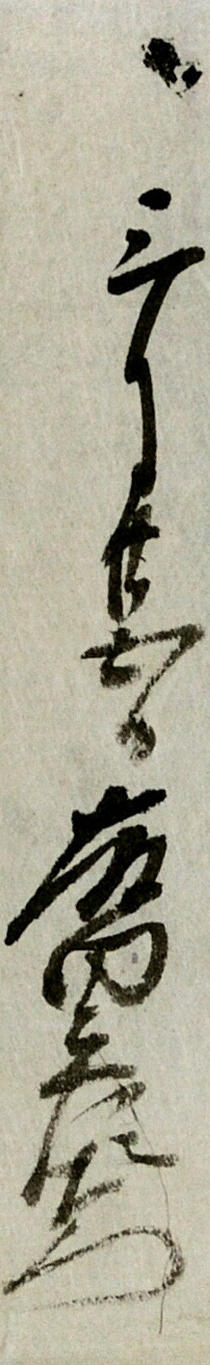三月廿五日藤田彦左衛門
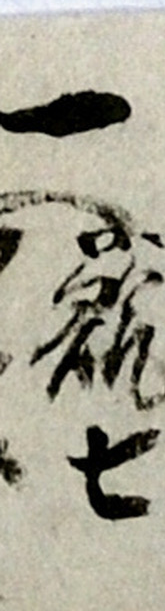一鯇七
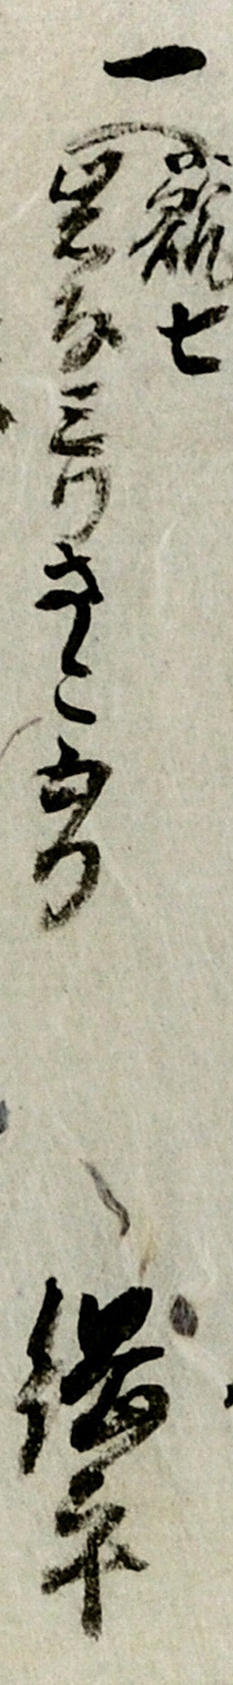岩な三つさこ五つ総平
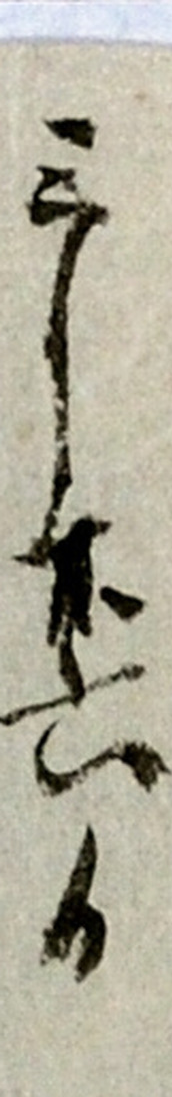三月廿六日
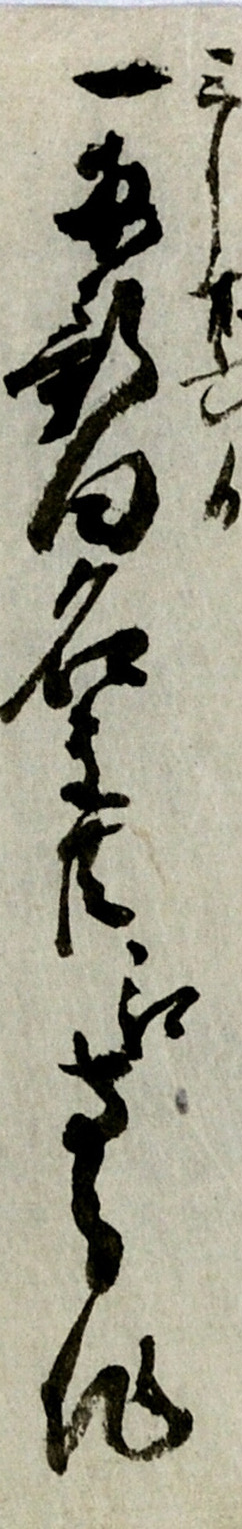一南新田名主共えさる作
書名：分一方諸事御用留帳
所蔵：伊那市立高遠町図書館・合同会社AMANE
